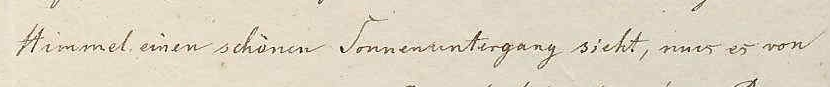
Himmel einen schönen Sonnenuntergang sieht, mus es von
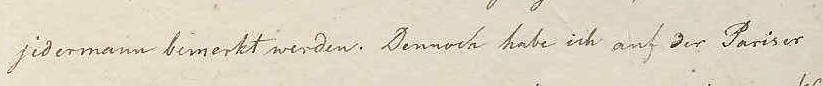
jedermann bemerkt werden. Dennoch habe ich auf der Pariser
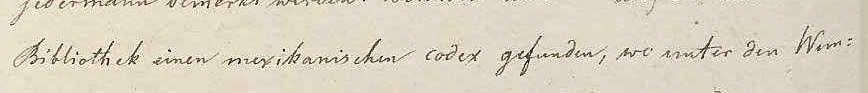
Bibliothek einen mexikanischen codex gefunden, wo unter den Wun-
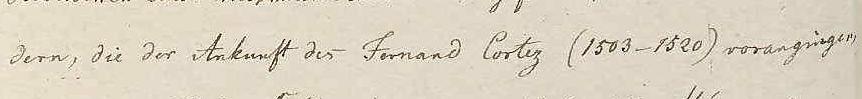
dern, die der Ankunft des Fernand Cortez vorangingen,
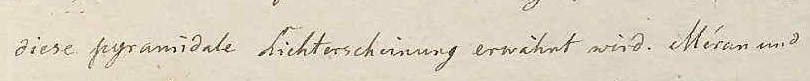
diese pyramidale Lichterscheinung erwähnt wird. Méran und
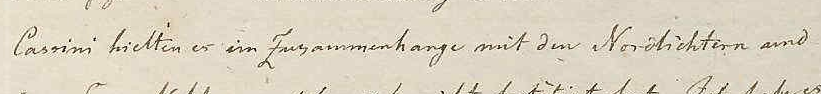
Cassini hielten es im Zusammenhange mit den Nordlichtern und
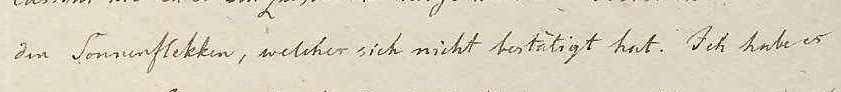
den Sonnenflekken, welches sich nicht bestätigt hat. Ich habe es
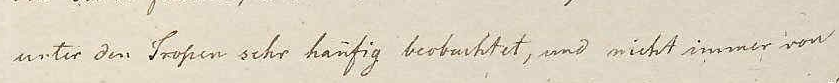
unter den Tropen sehr häufig beobachtet, und nicht immer von
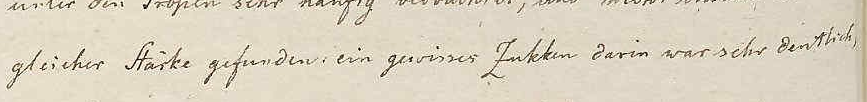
gleicher Stärke gefunden: ein gewisses Zukken darin war sehr deutlich,
